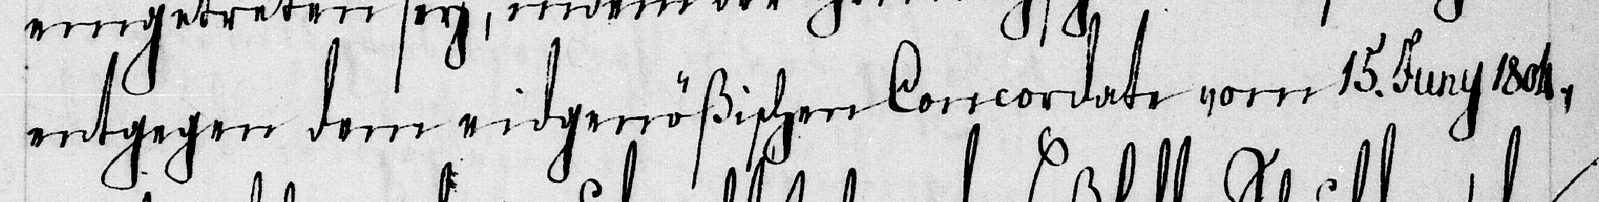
entgegen dem eidgenößischen Concordate vom 15. Juny 1804.,
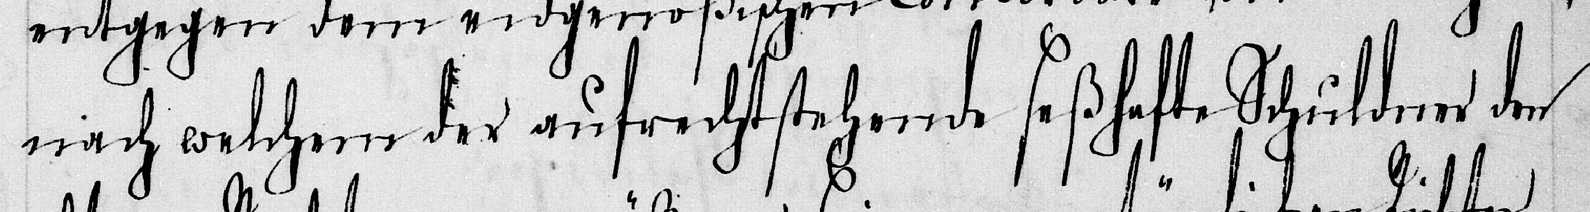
nach welchem der aufrechtstehende seßhafte Schuldner den
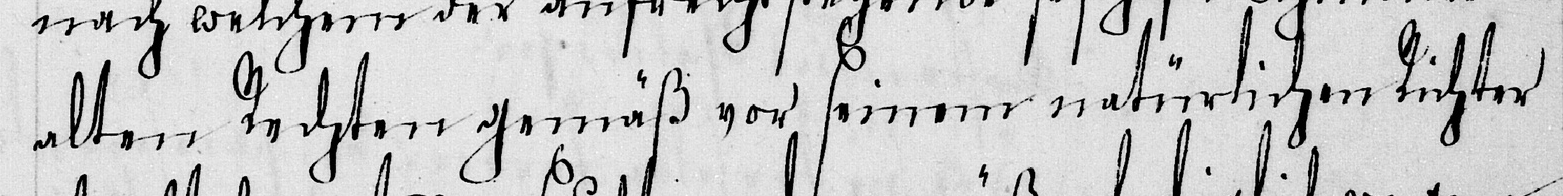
alten Rechten gemäß von seinem natürlichen Richter
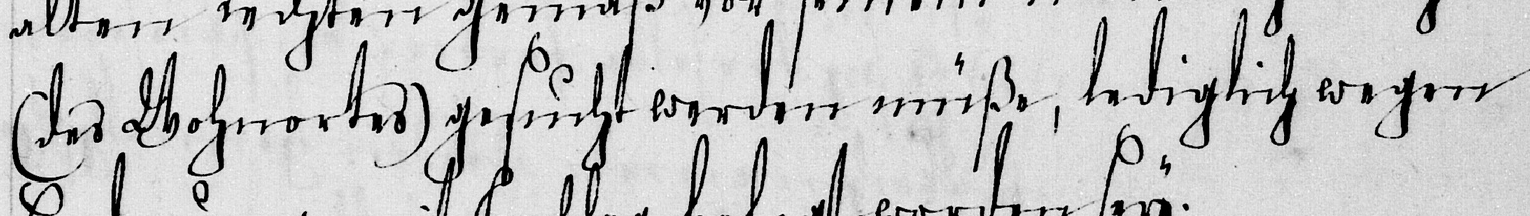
(des Wohnortes) gesucht werden müße, lediglich wegen
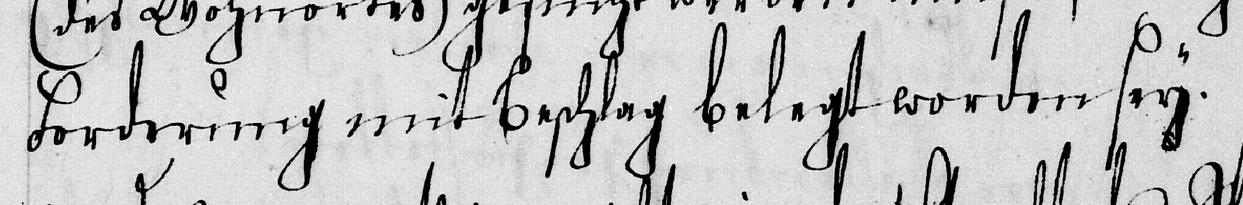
Forderung mit Beschlag belegt worden sey.
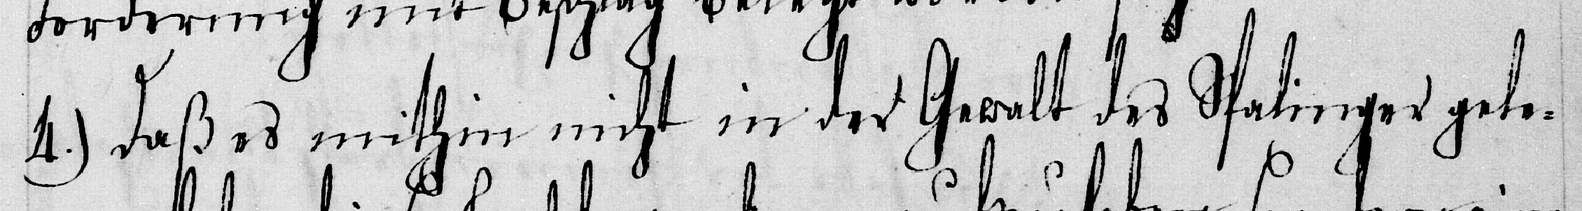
4.) Daß es mithin nicht in der Gewalt des Spalinger gele¬
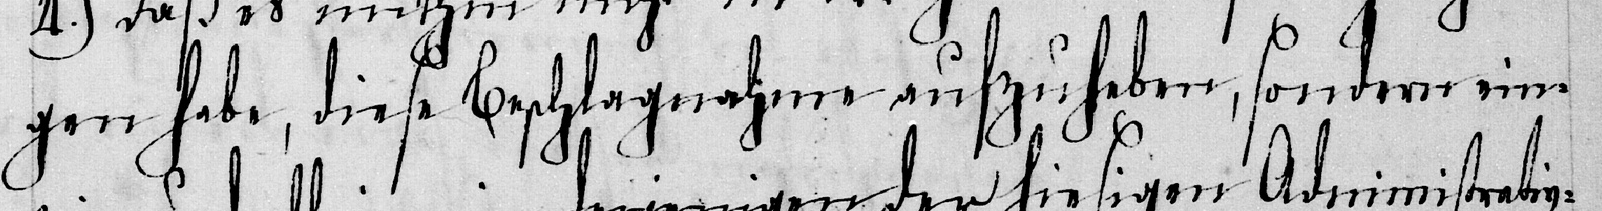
gen habe, diese Beschlagnahme aufzuheben, sondern ein¬
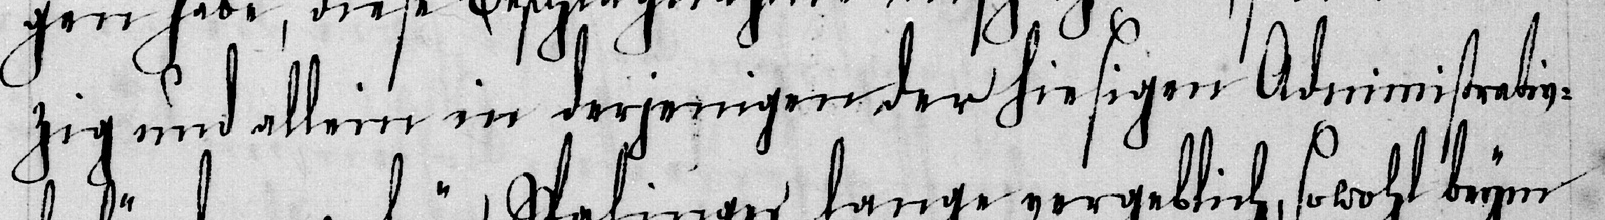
zig und allein in derjenigen der hiesigen Administration¬
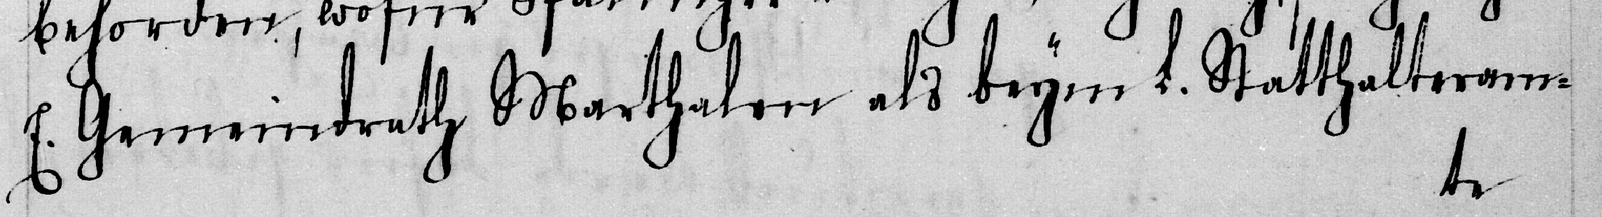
E. Gemeindrath Marthalen als beym L. Statthalteram-
